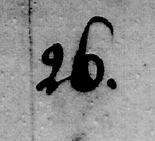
90.
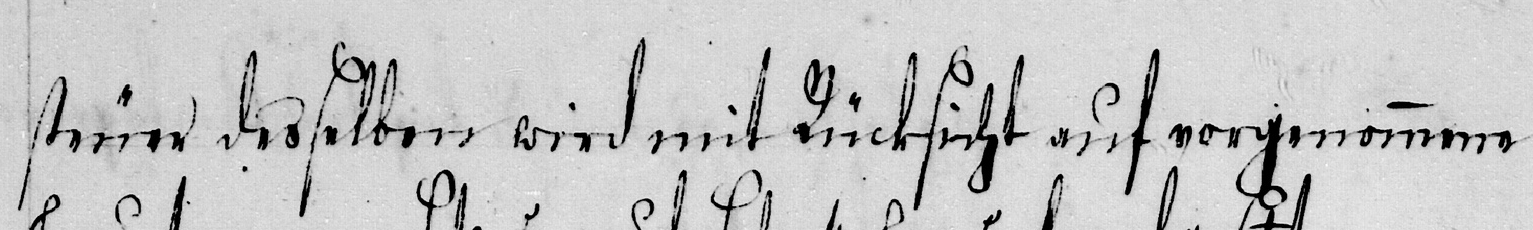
steuer desselben wird mit Rücksicht auf vorgenommene
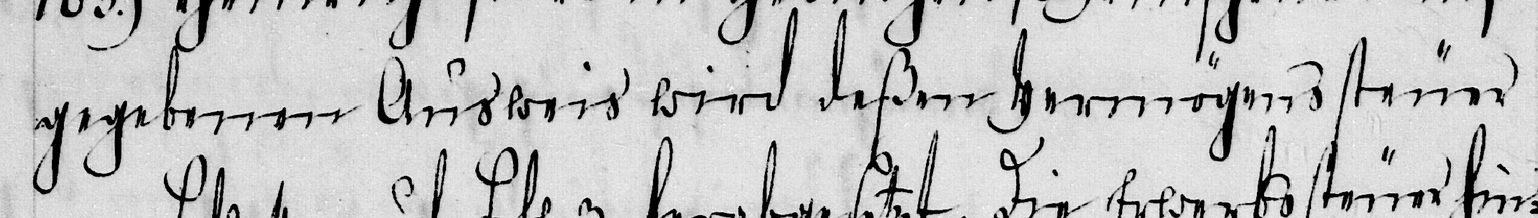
gegebenen Ausweis wird deßen Vermögenssteuer
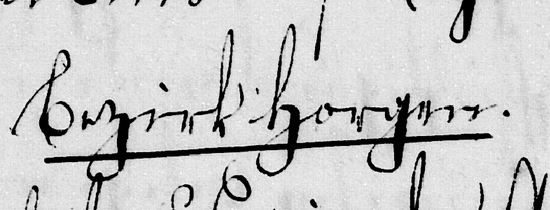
Bezirk Horgen.
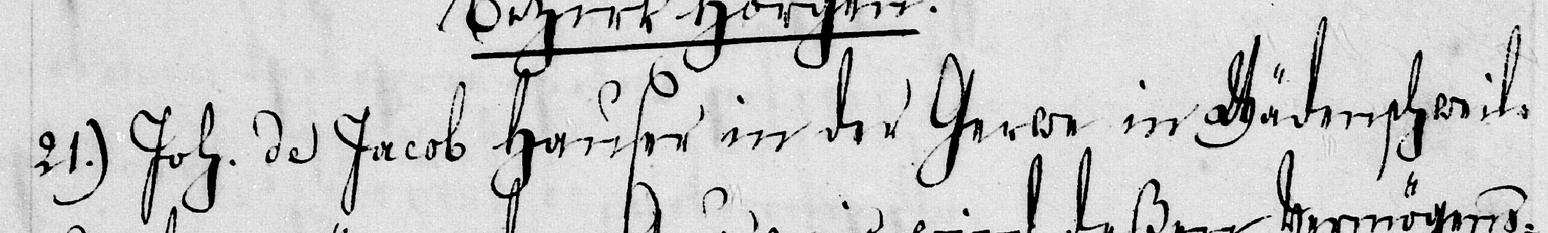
21.) Joh. de Jacob Hauser in der Gerwe in Wädenschweil.
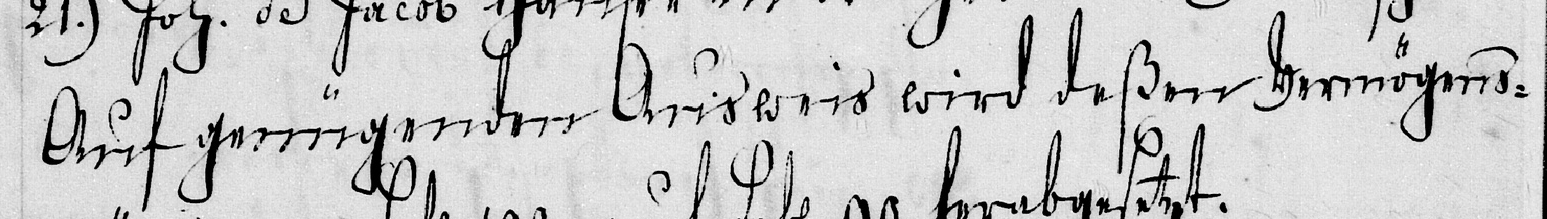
Auf genügenden Ausweis wird deßen Vermögens¬
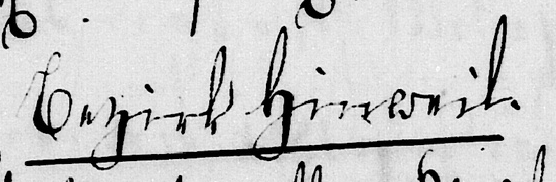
Bezirk Hinweil.
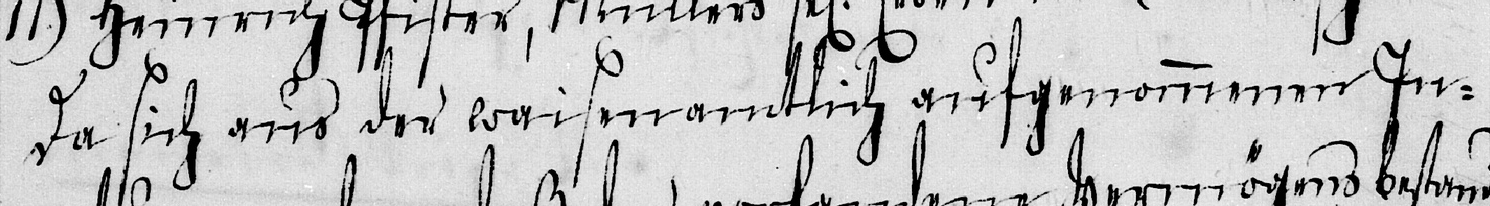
Da sich aus der waisenamtlich aufgenommenen In¬
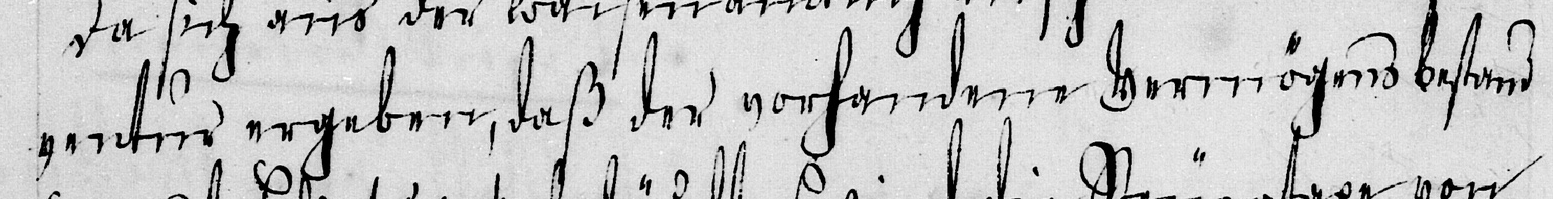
ventur ergeben, daß der vorhandene Vermögensbestand
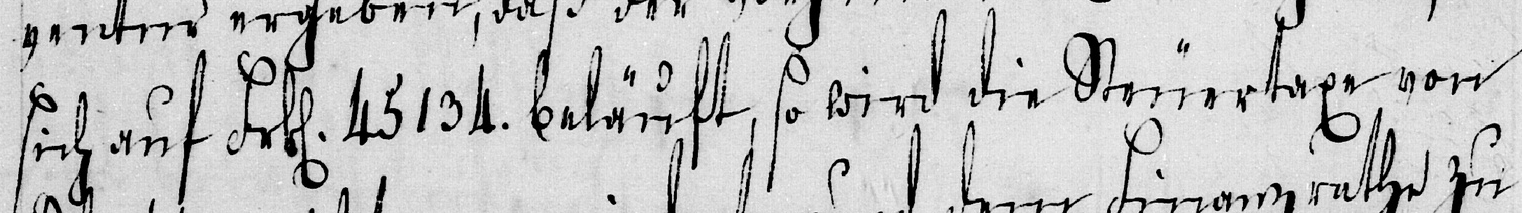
sich auf Frk[en]. 45134. beläuft, so wird die Steuertaxe von
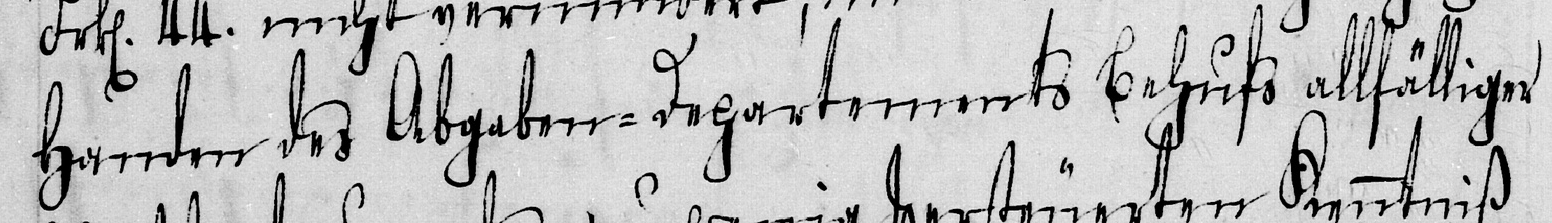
Handen des Abgaben-Departements Behufs allfällig¬
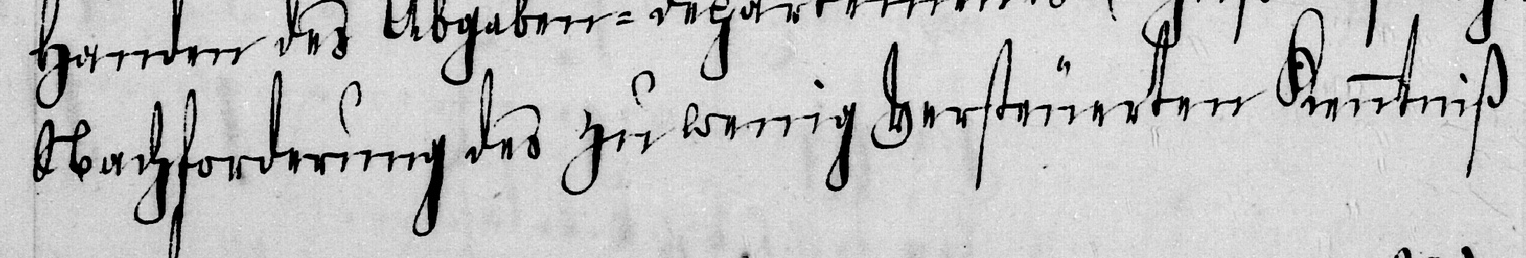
Nachforderung des zu wenig Versteuerten Kenntniß
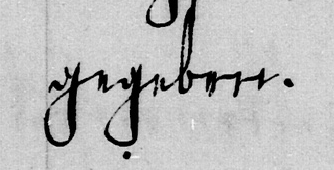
gegeben.
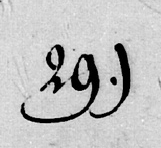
22.)
